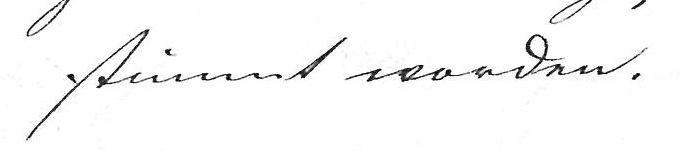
stimmt worden.
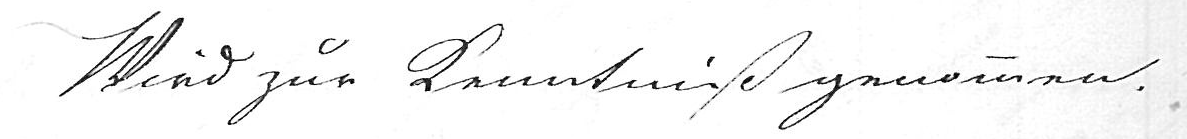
Wird zur Kenntniß genommen.
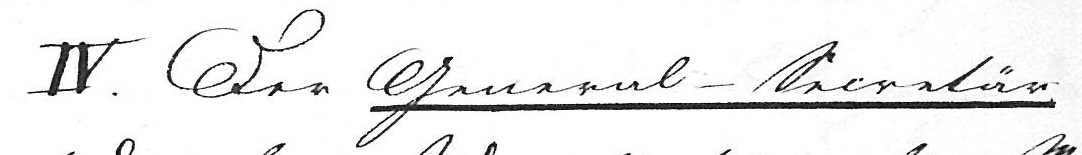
IV. Der General-Secretär
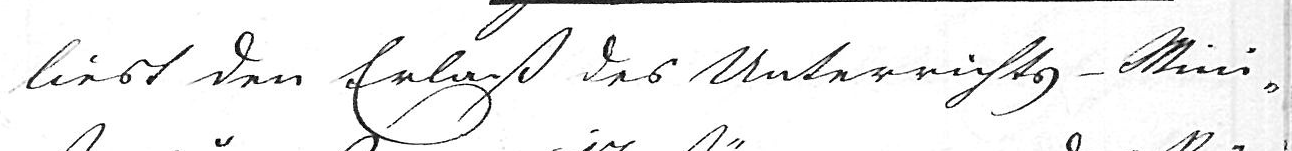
liest den Erlaß des Unterrichts-Mini-
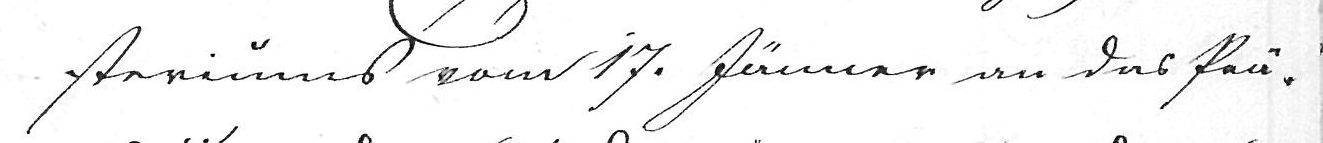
sterium vom 17. Jänner an das Prä-
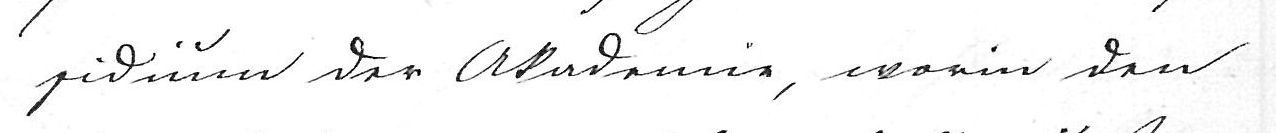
sidium der Akademie, worin den
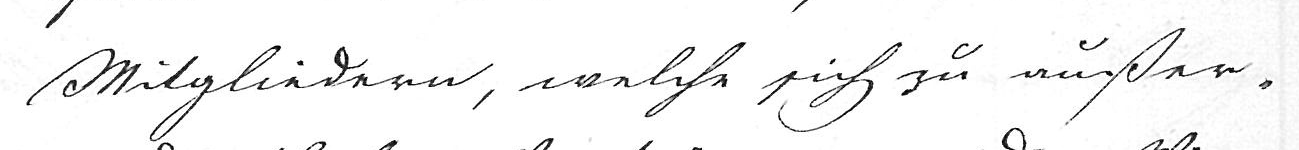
Mitgliedern, welche sich zu außer-
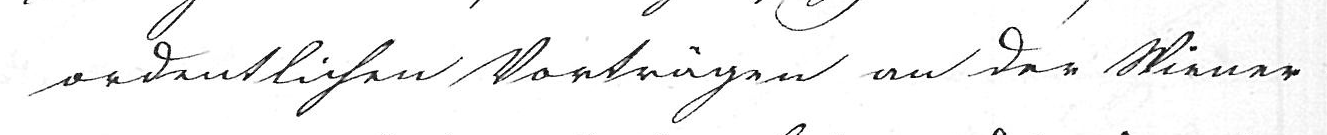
ordentlichen Vorträgen an der Wiener
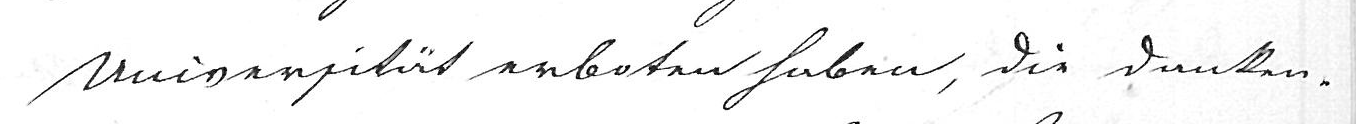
Universität erboten haben, die danken-
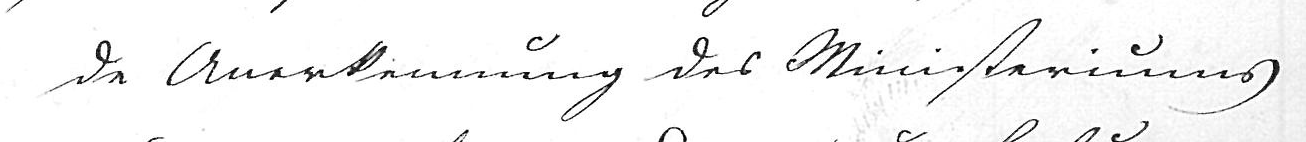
de Anerkennung des Ministeriums
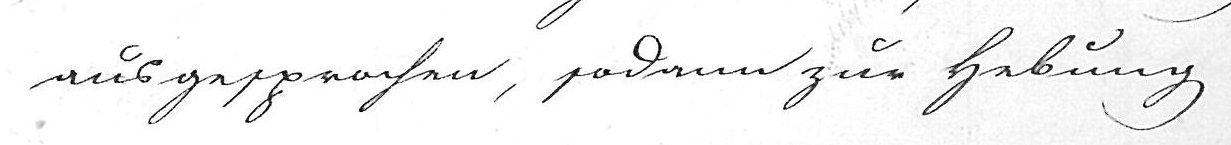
ausgesprochen, sodann zur Hebung
